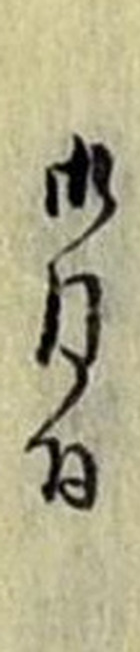御目付
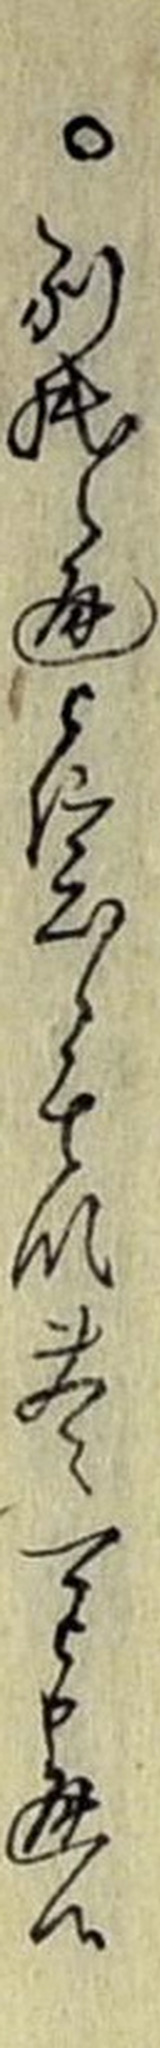○別紙之通被仰出候其段夫々可被申通候
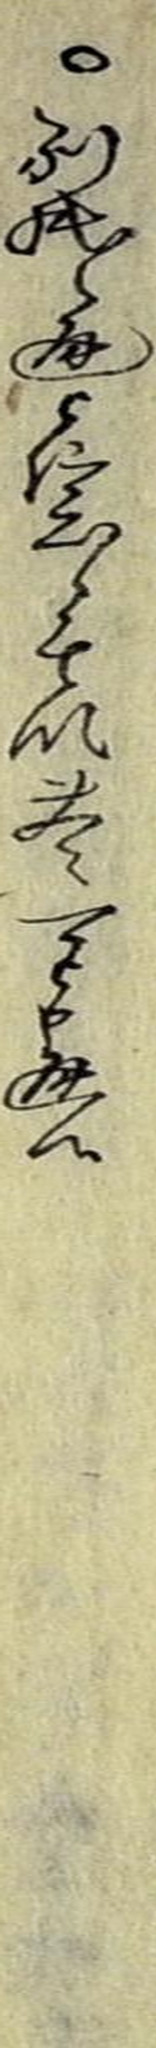○別紙之通被仰出候其段夫々可被申通候
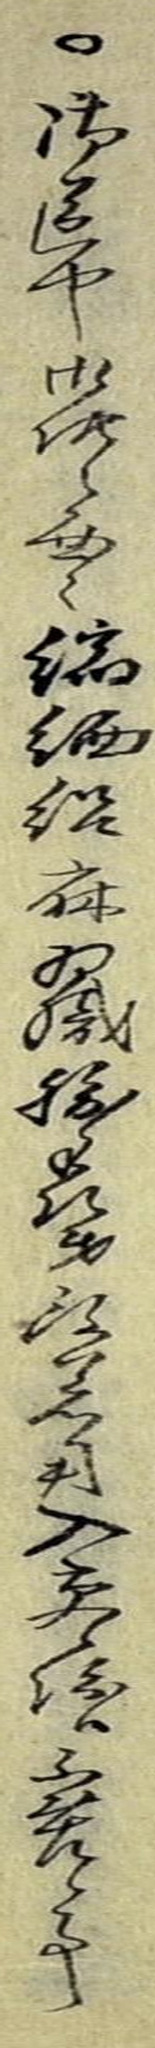○御道中御供之面々縮緬絽麻羽織勝手次第致着用入交之儀は不苦候事
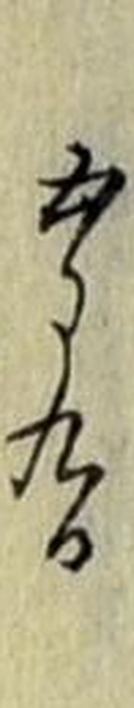五月七日
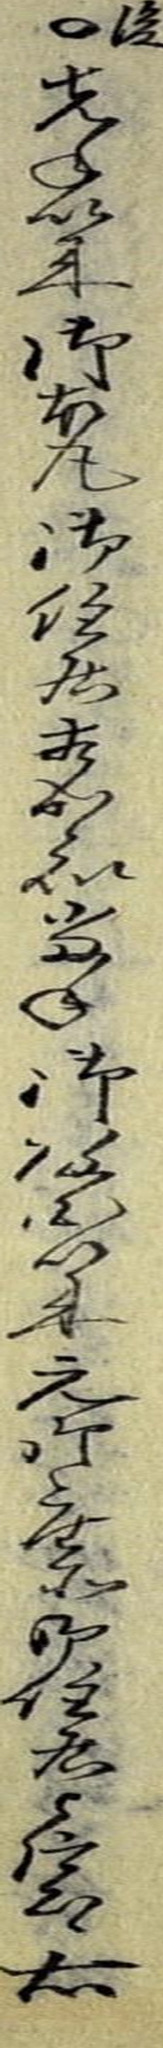○先年以來御本丸御住居相成候処当年御帰国以来元御座所御住居被仰出候右
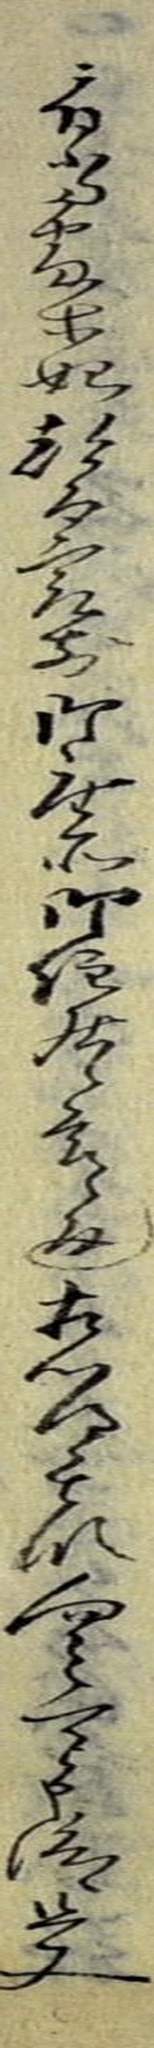に付当番等始都而最前御座所御住居之節之通相心得其段向々可被申渡候且又
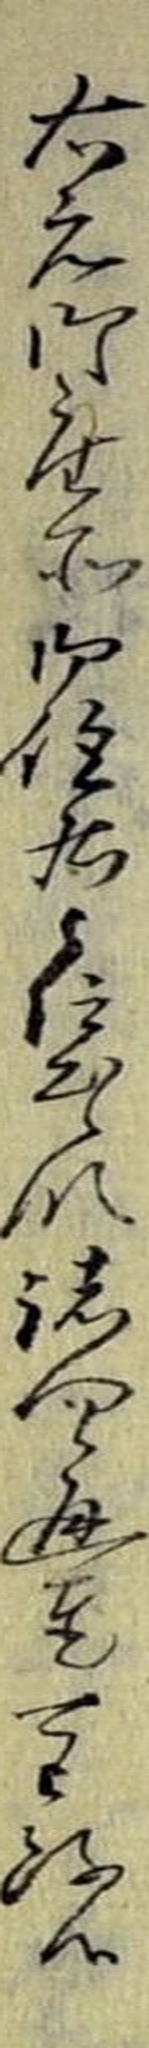右元御座所御住居被仰出候段諸向へ通達可被致候
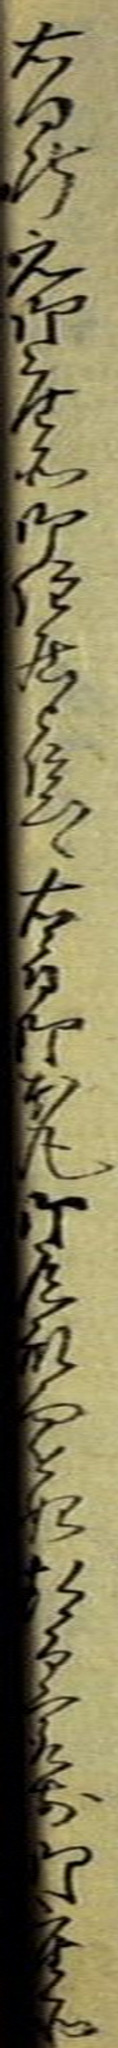○右同断元御座所御住居被仰出候右に付御本丸御屋形向を始都而最前御座所
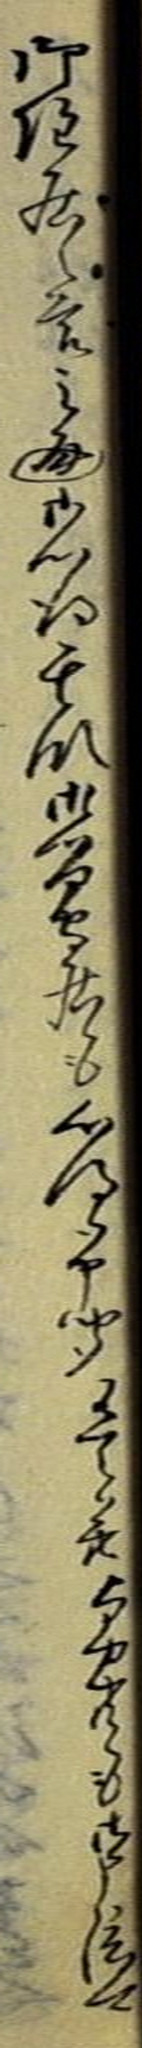御住居之節之通御心得其段御留守居へも心得御申聞有之候へ共与力共へも御申渡可
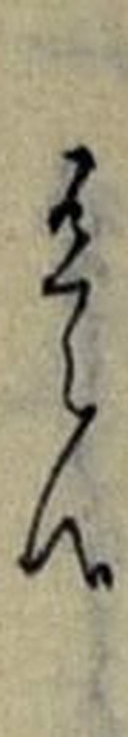有之候
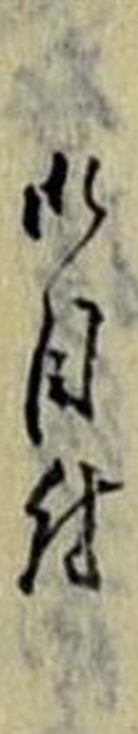御目付
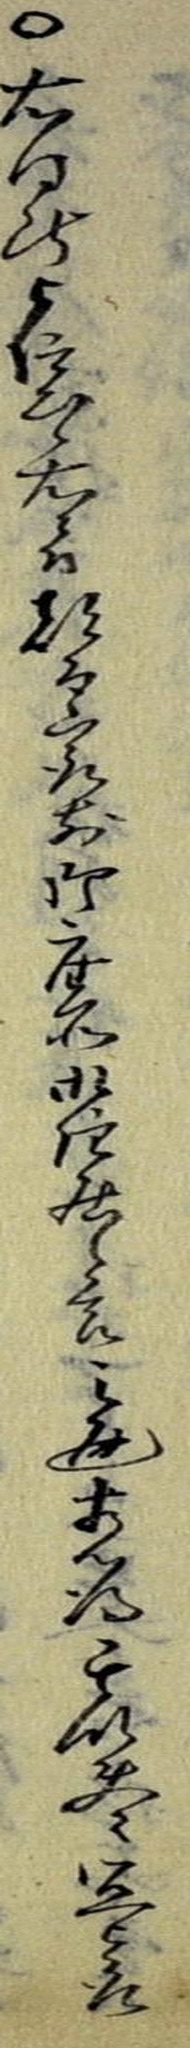○右同断被仰出候右に付都而最前御座所御住居之節之通相心得其段夫々宜被取
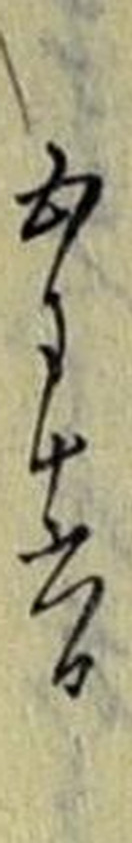五月十六日
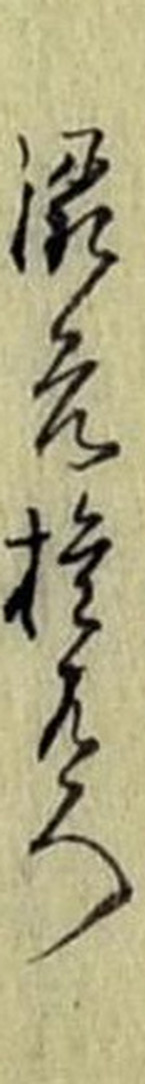渋谷権左衛門
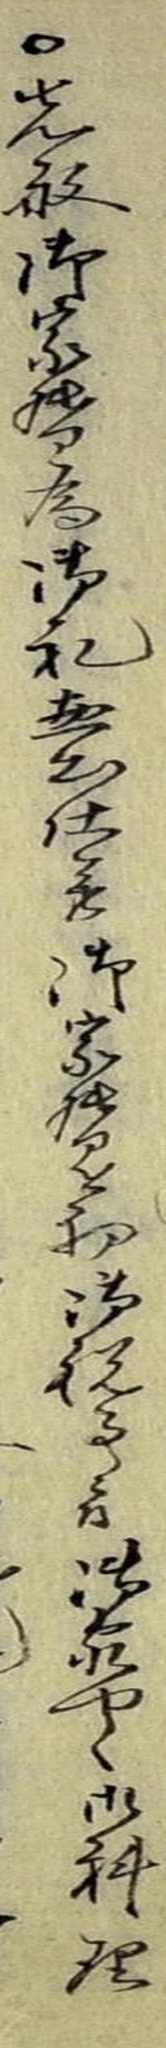○先般御家督為御礼惣出仕并御家督を初御祝事に付御家中へ御料理
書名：命令之部 六
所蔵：福井県文書館 Fukui Prefectural Archives
